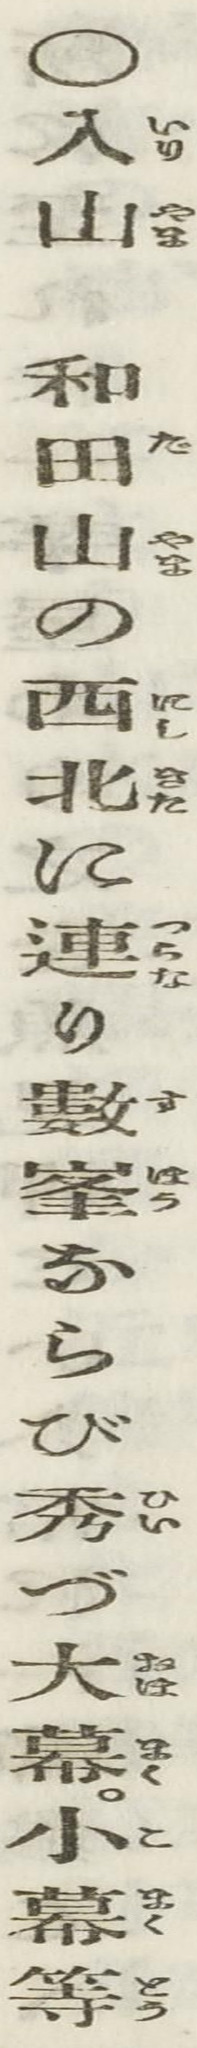○入山和田山の西北に連り数峯ならび秀づ大幕。小幕等
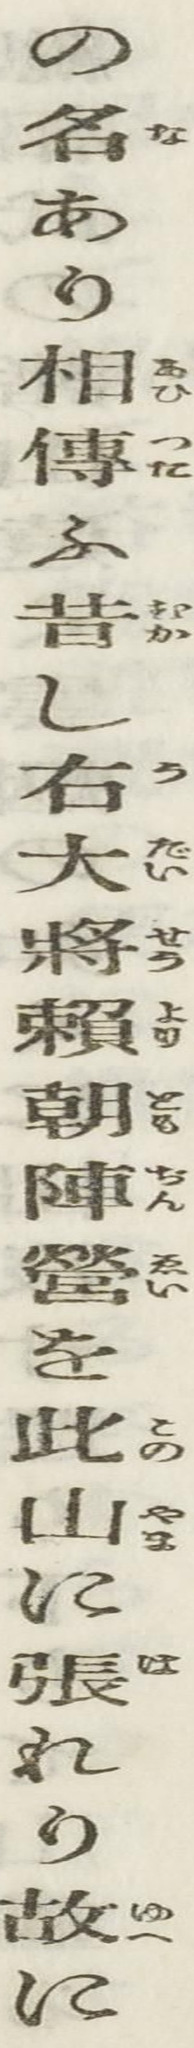の名あり相伝ふ昔し右大将頼朝陣営を此山に張れり故に
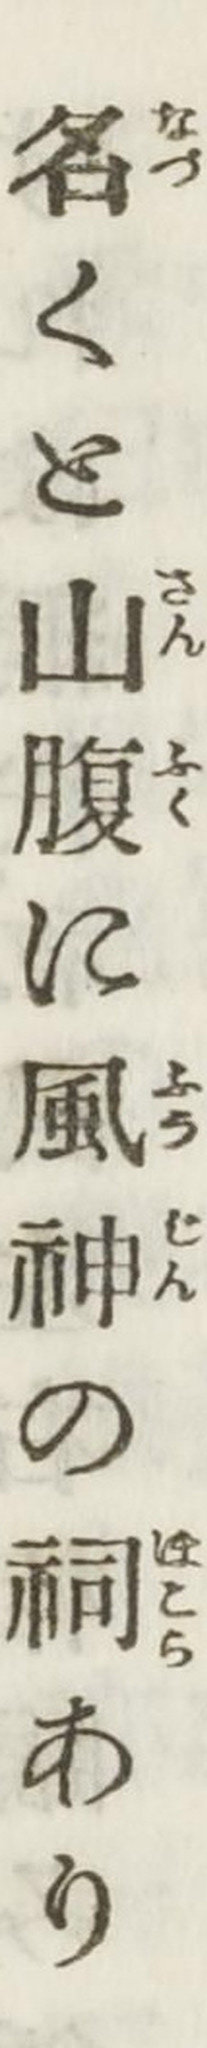名くと山腹に風神の祠あり
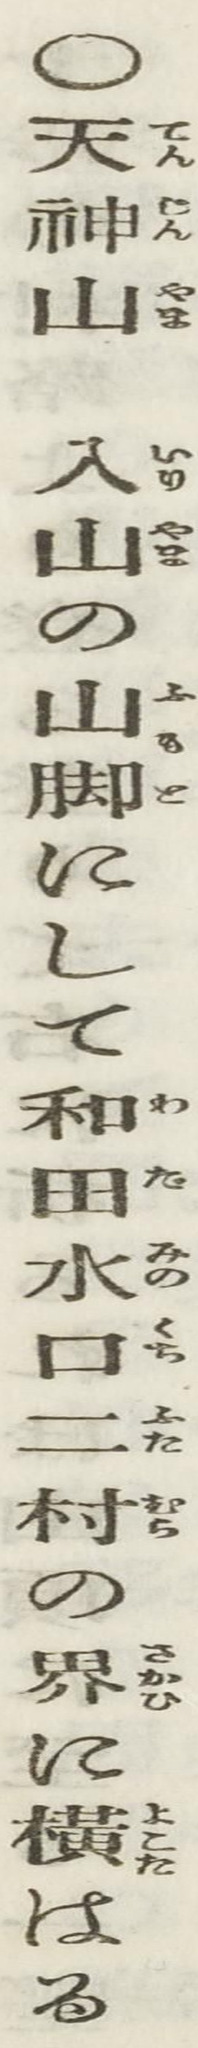○天神山入山の山脚にして和田水口二村の界に横はる
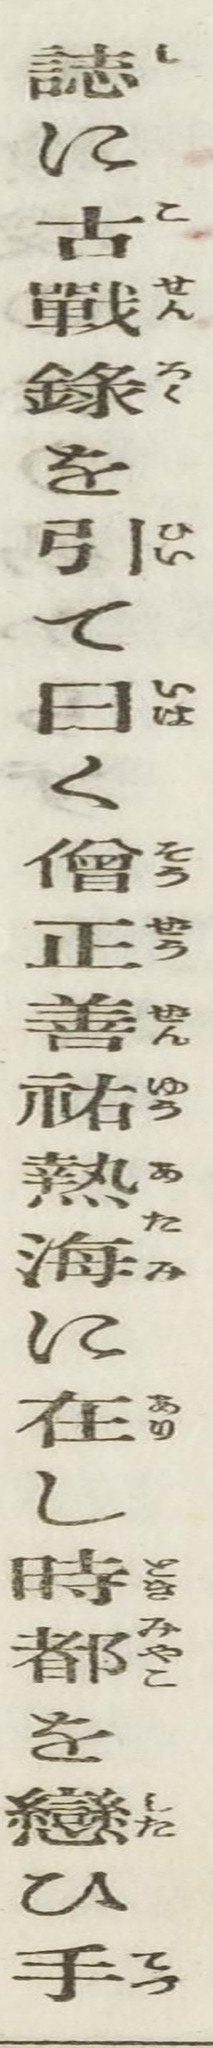誌に古戦録を引て曰く僧正善祐熱海に在し時都を恋ひ手
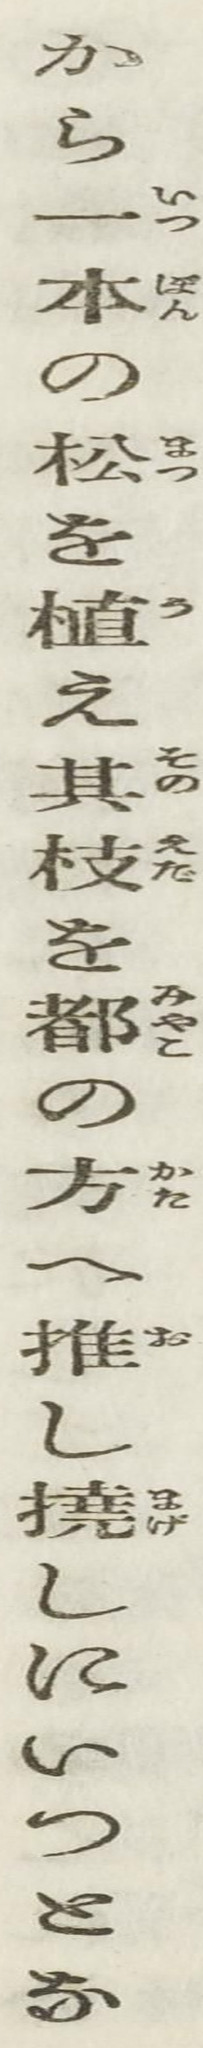から一本の松を植え其枝を都の方へ推し撓しにいつとな
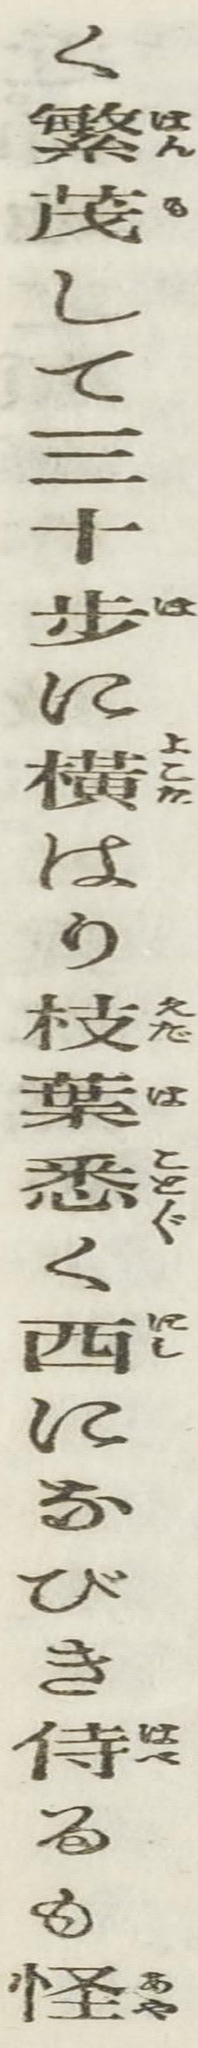く繁茂して三十歩に横はり枝葉悉く西になびき侍るも怪
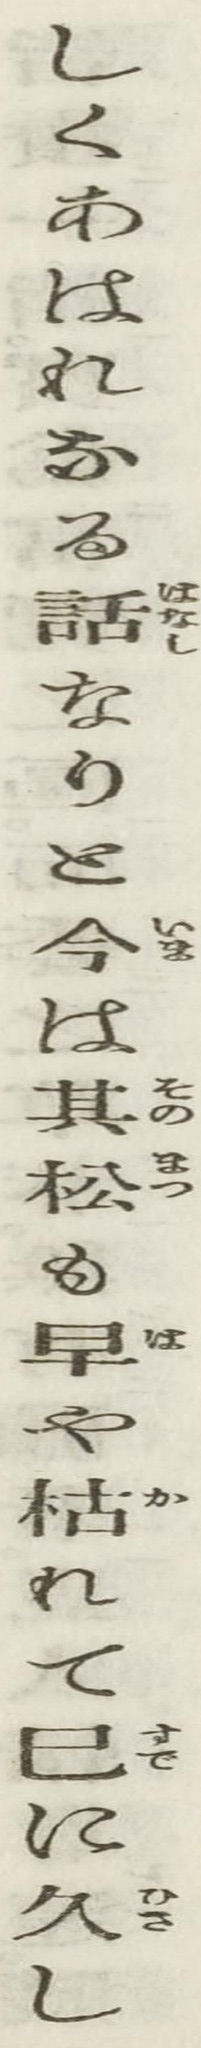しくあはれなる話なりと今は其松も早や枯れて巳に久し
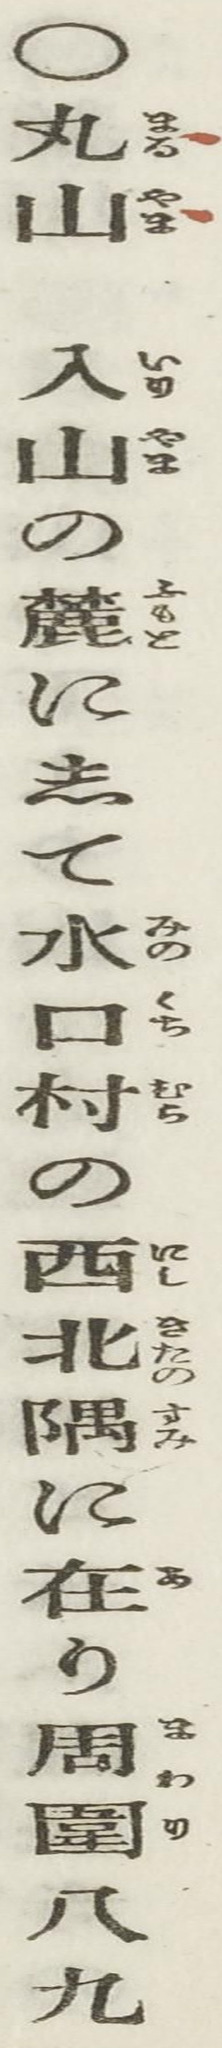○丸山入山の麓にして水口村の西北隅に在り周囲八九
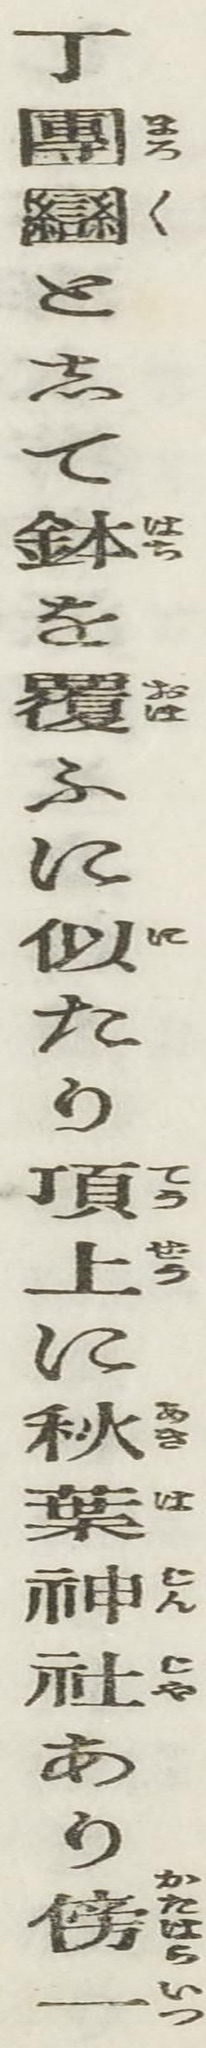丁團圝として鉢を覆ふに似たり頂上に秋葉神社あり傍一
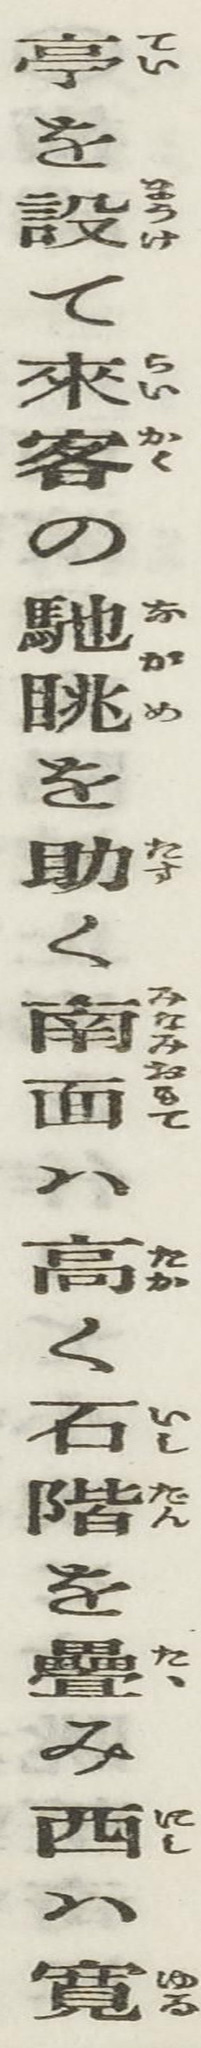亭を設て来客の馳眺を助く南面は高く石階を畳み西は寛
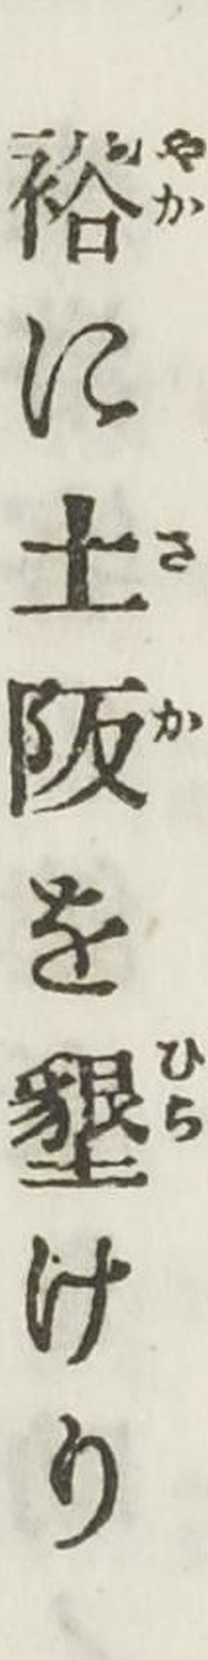裕に土阪を墾けり
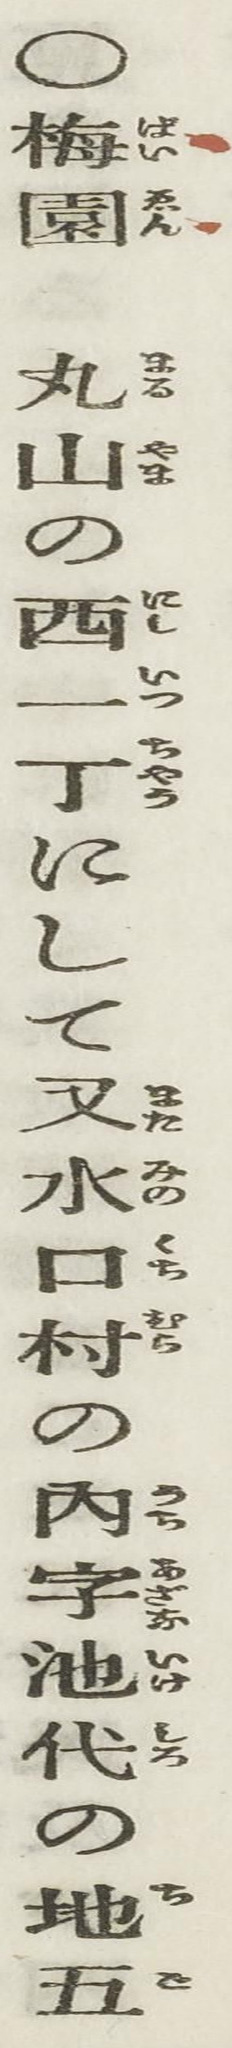○梅園丸山の西一丁にして又水口村の内字池代の地五
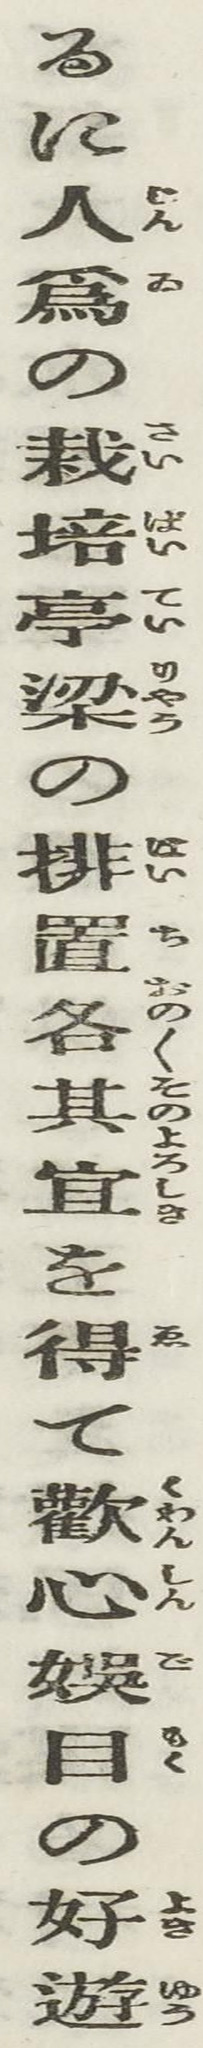るに人為の栽培亭梁の排置各其宜を得て歓心娯目の好遊
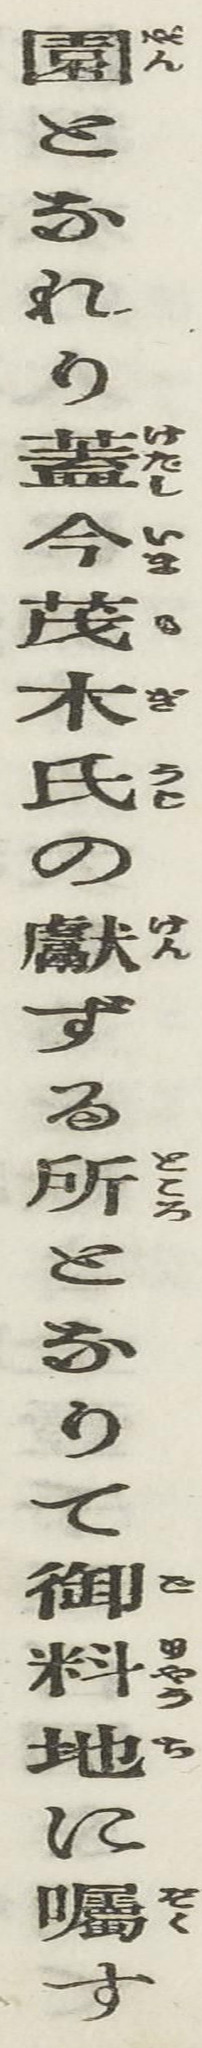園となれり蓋今茂木氏の献ずる所となりて御料地に属す
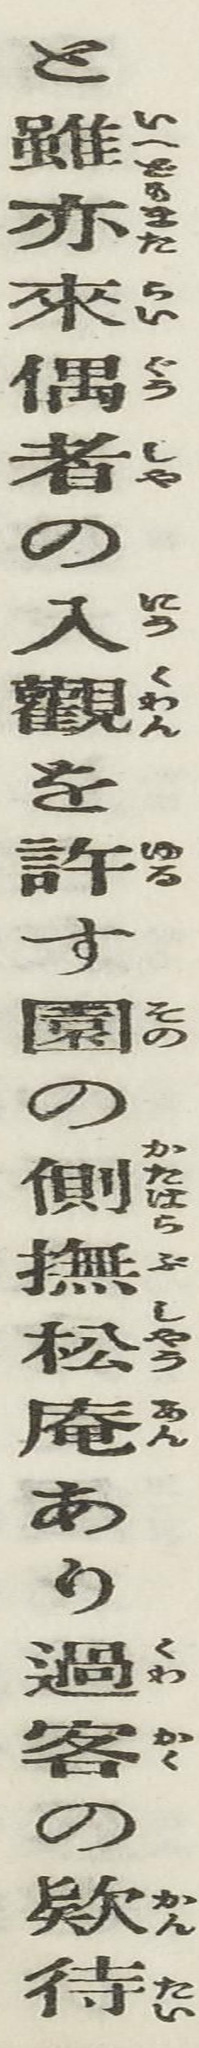と雖亦来偶者の入観を許す園の側撫松庵あり過客の欵待
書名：熱海獨案内　全
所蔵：東京大学地震研究所図書室 Earthquake Research Institute Library, The University of Tokyo, JAPAN
